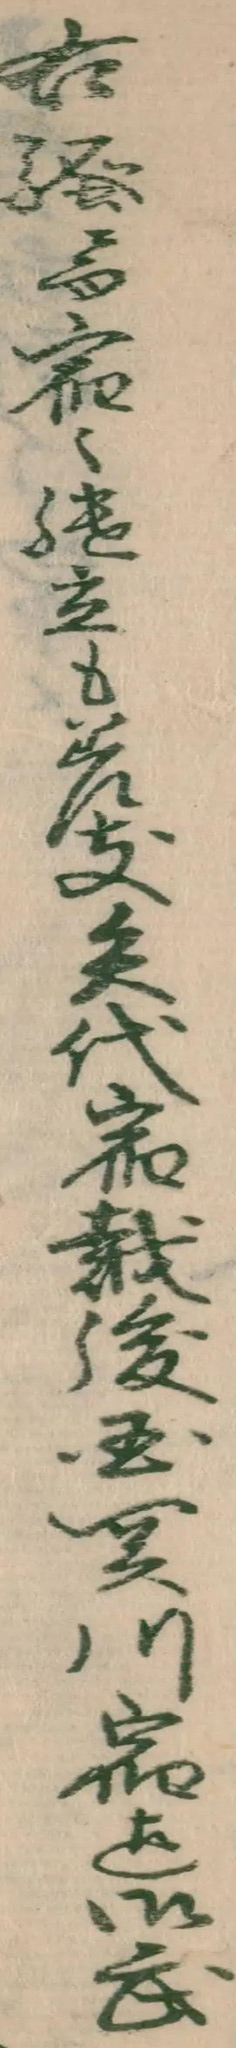右騒ニ而宿之継立も差支矢代宿越後国関川宿迄御武
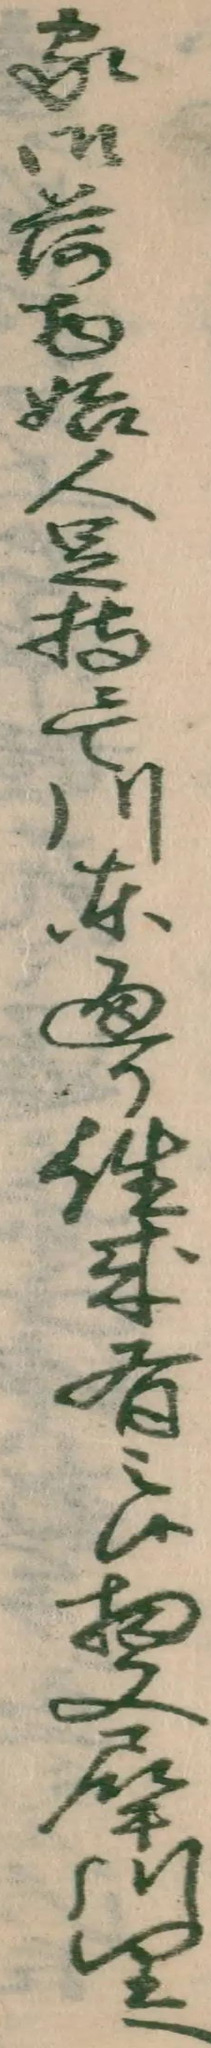家御荷物始人足持ニて川東通り往来有之候扨又犀川里へ
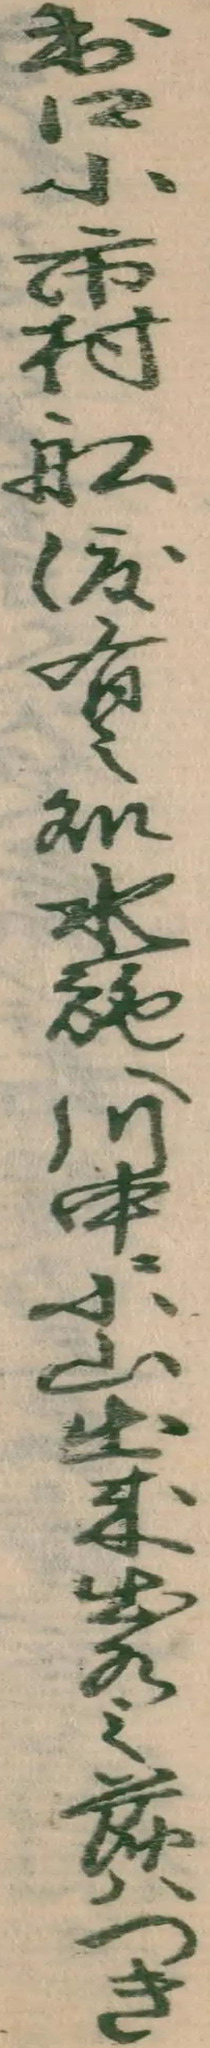出口小市村船渡有之処水施へ川中ニ小山出来出水之節はつき
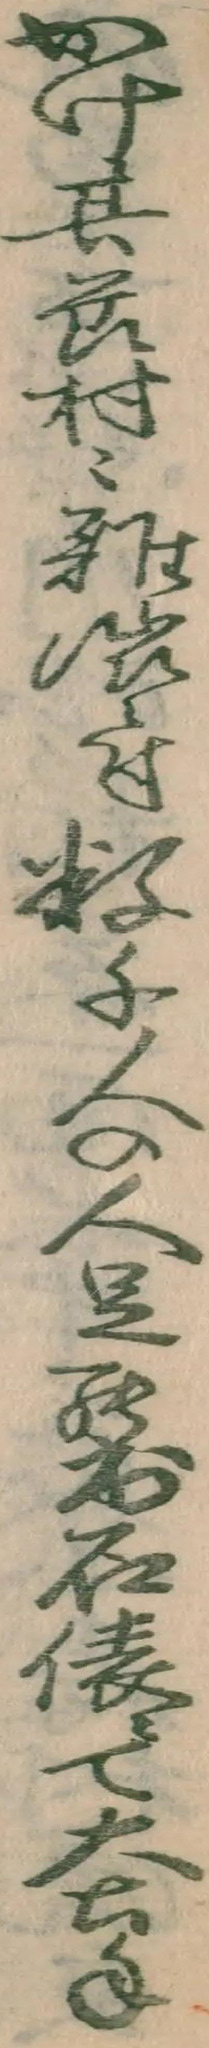かけ其節村〻難渋ニ付数千人の人足罷出石俵ニて大土手
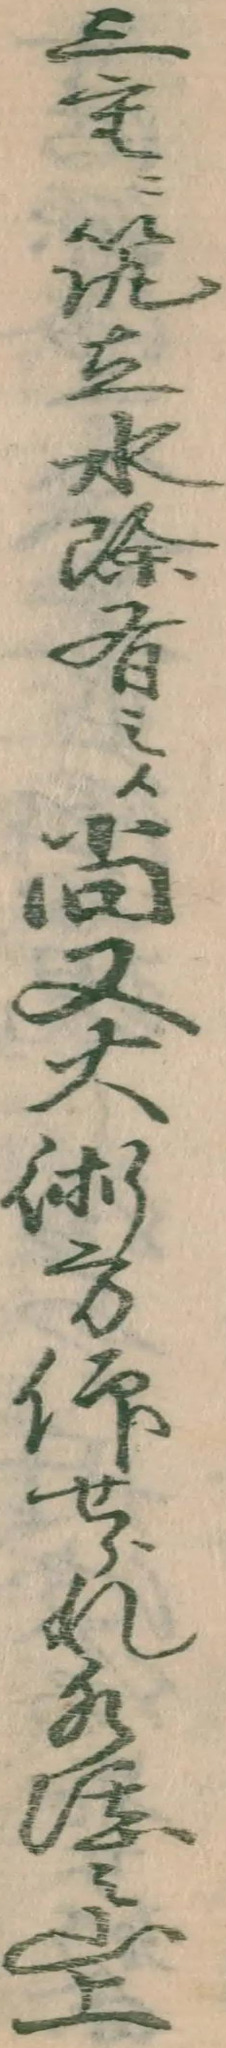三重ニ筑立水除有之候尚又火術方仰せられ水湛之山上
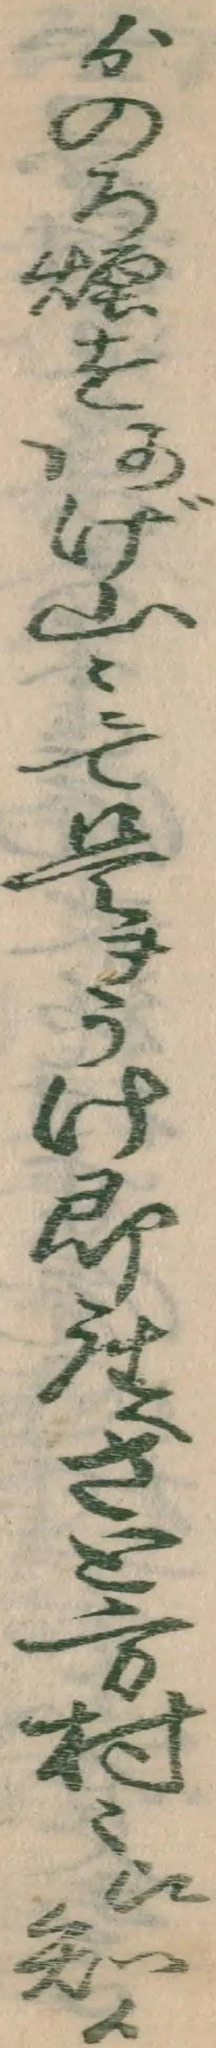ゟのろ煙をあげ山〻ニて是ヲうけ即座へさと方村〻え知候
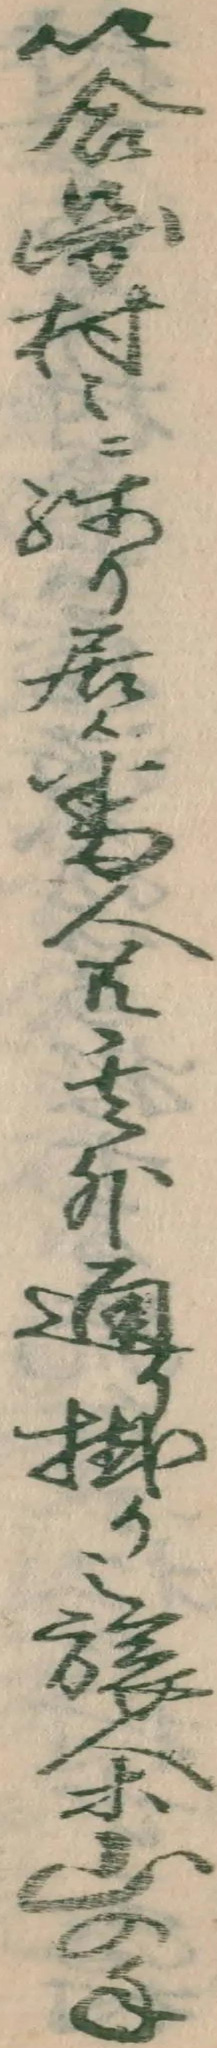以合図村〻ニ残り居候番人共其外通り掛り之旅人等山の手
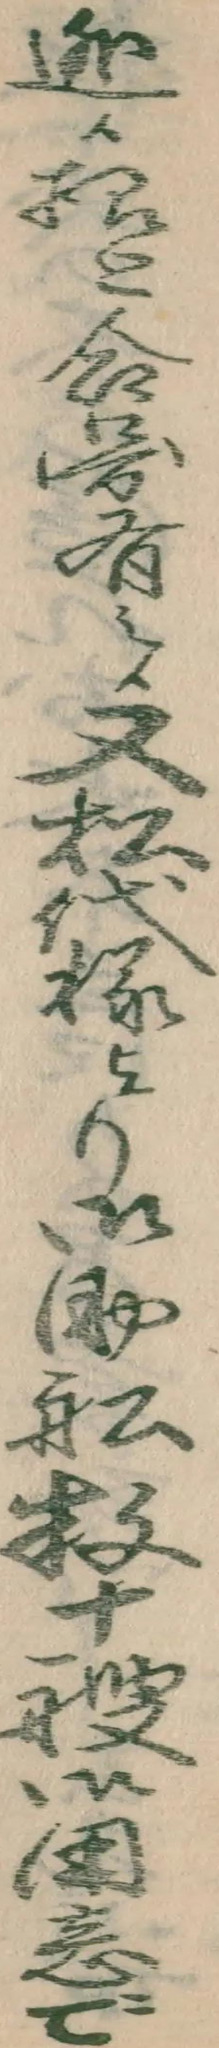逃候様と合図有之候又松代様より御助船数十艘御用意ニて
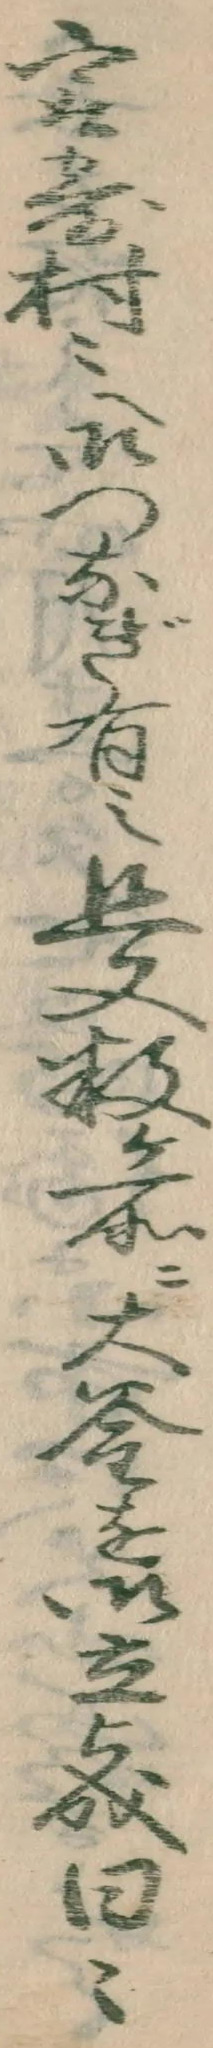最寄村〻へ御つなぎ有之且又数ケ所ニ大釜を御立被成日〻
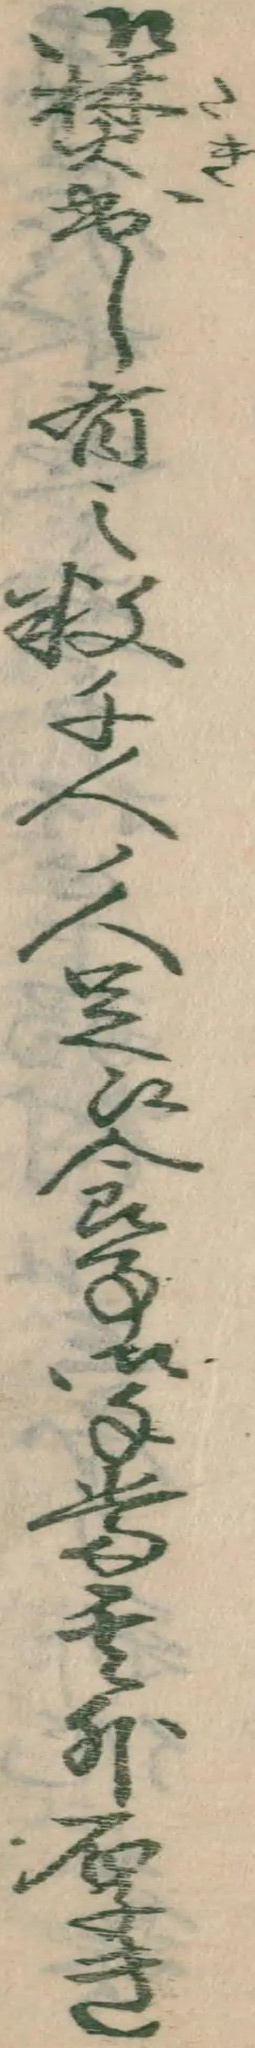御焚出し有之数千人ノ人足え食事御手当其外厚き
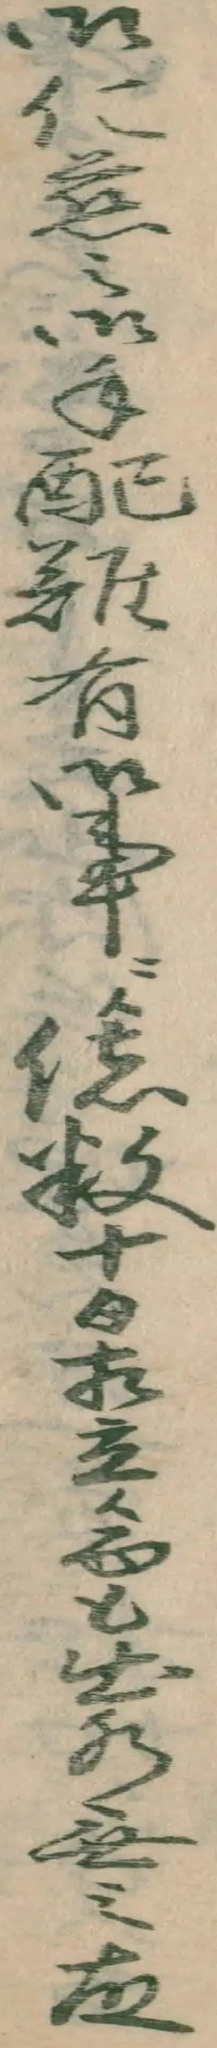御仁慈之御手配難有御事ニ候偖数十日相立候而も出水無之故

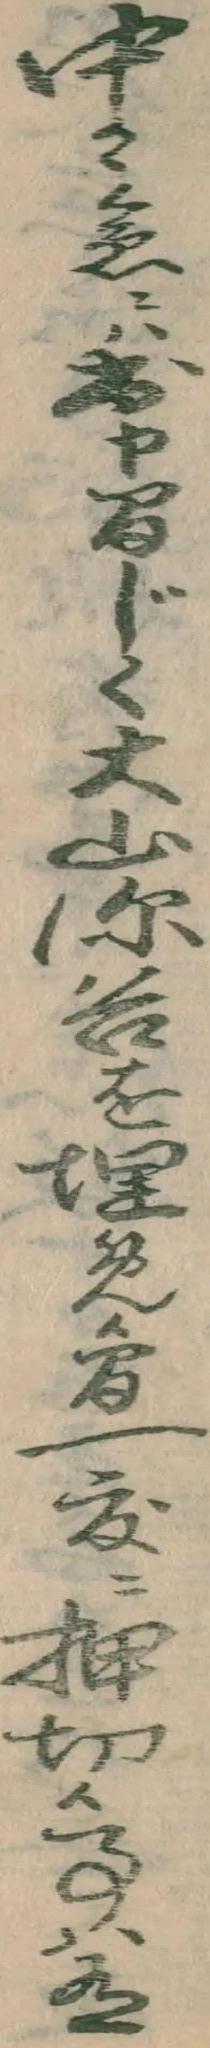中〻急ニは出申間じく大山深谷を埋め候間一度ニ押切候事は有
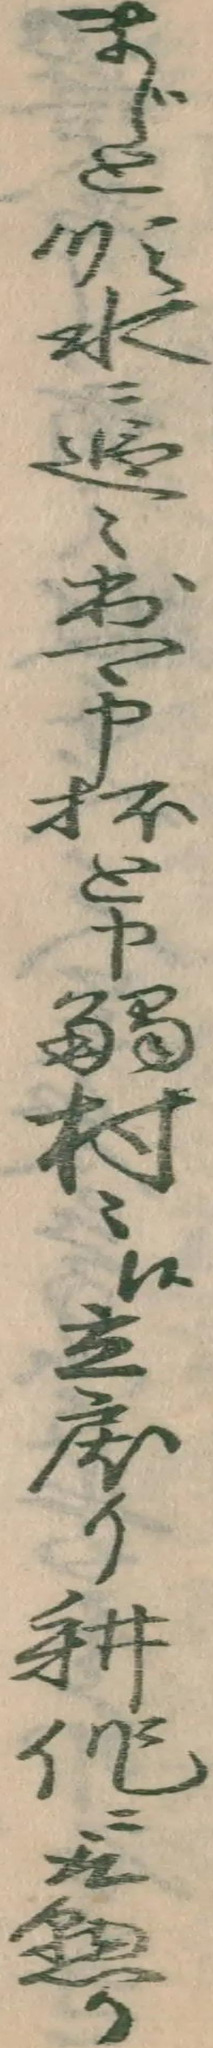まじと順水ニ追〻出可申抔と申触村〻え立戻り耕作ニ取懸り
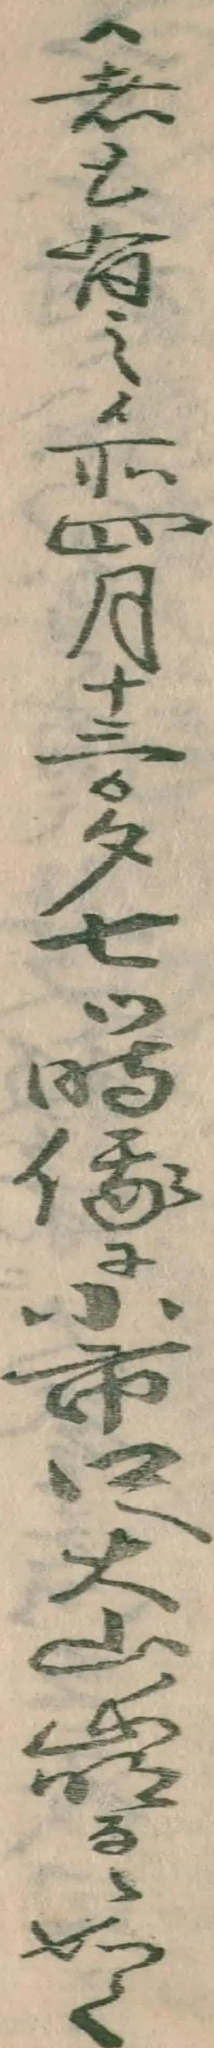候者も有之候所四月十三日夕七ツ時俄に小市口へ大山ノ崩るゝ如く
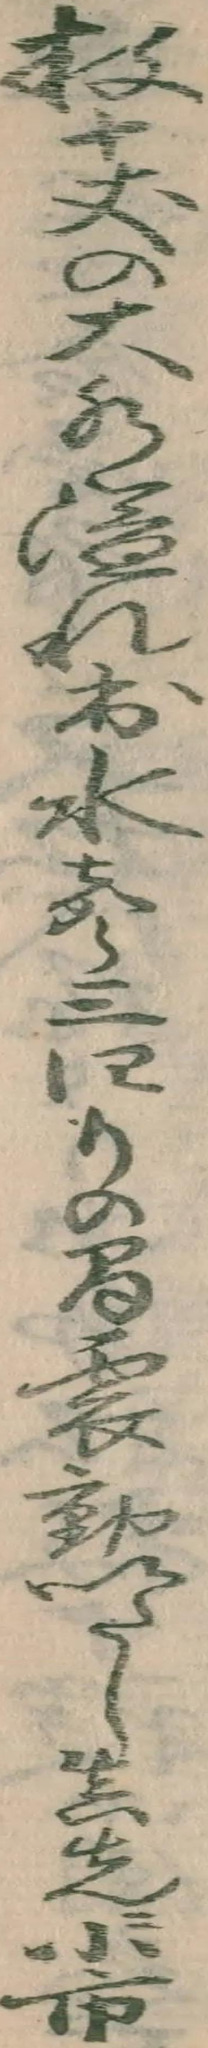数十丈の大水溢れ出水声三四りの間震動いたし真先ニ小市
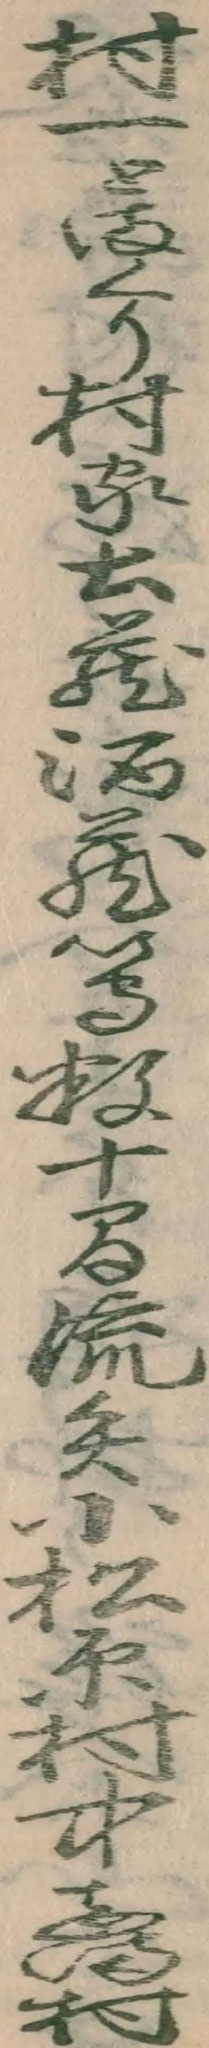村一とまくり村家土蔵酒屋等数十間流失小松原村中しま村
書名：大地震
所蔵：国立国会図書館 National Diet Library, JAPAN
